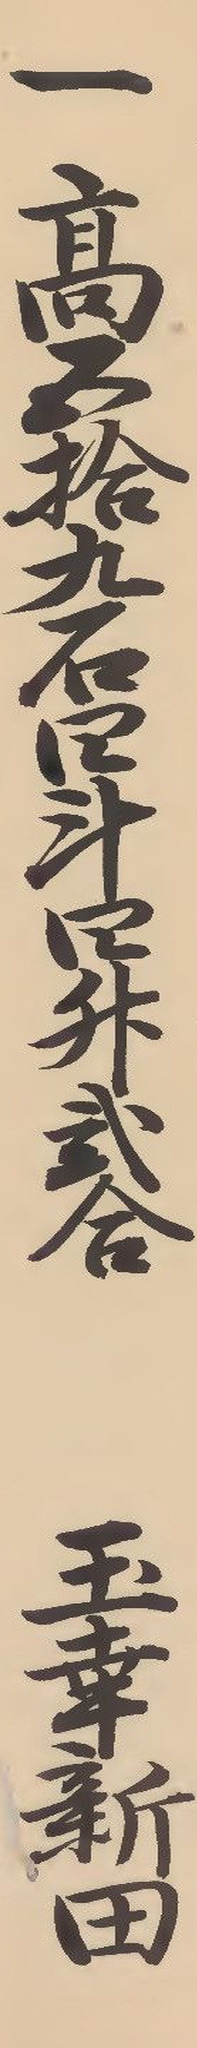一高五拾九石四斗四升弐合玉幸新田
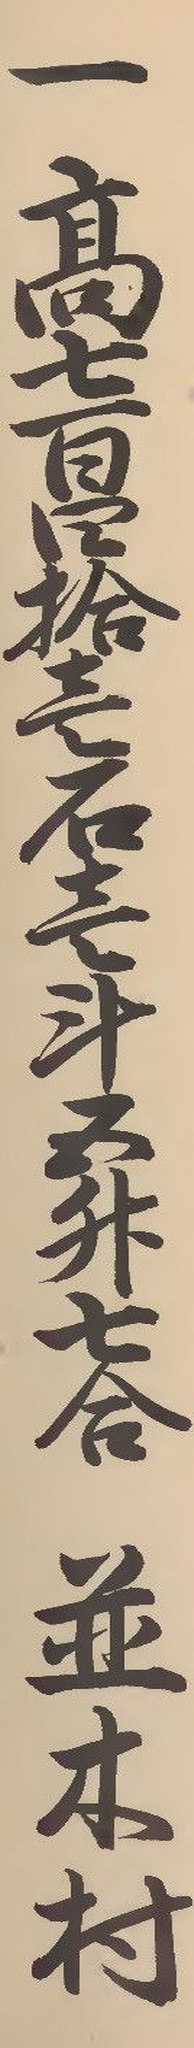一高七百四拾壱石壱斗五升七合並木村
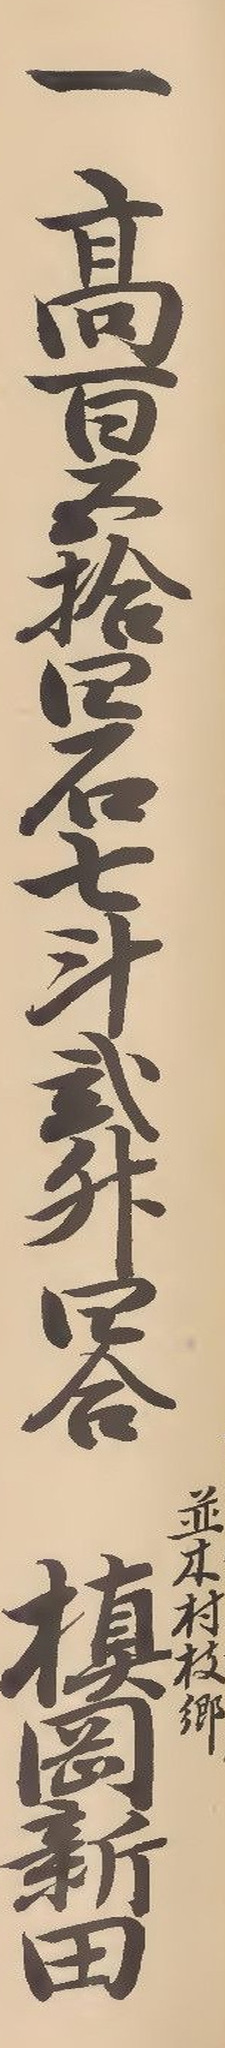一高百五拾四石七斗弐升四合槙岡新田
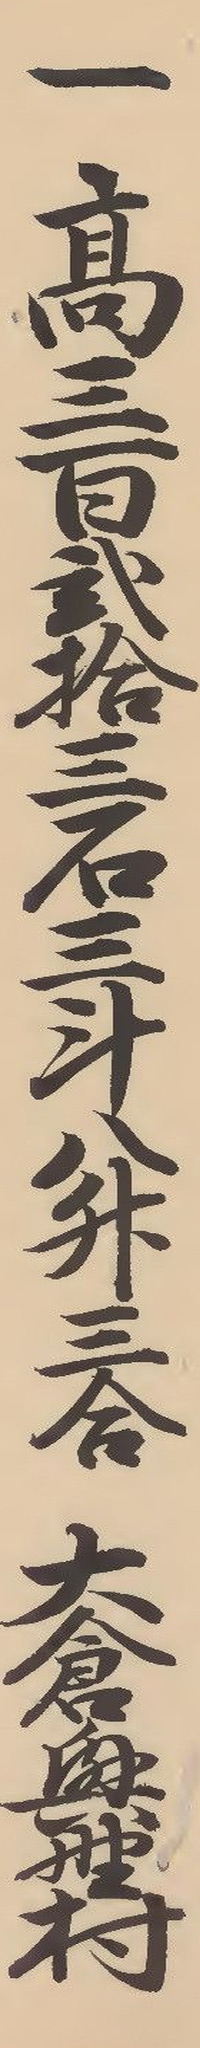一高三百弐拾三石三斗八升三合大倉興野村
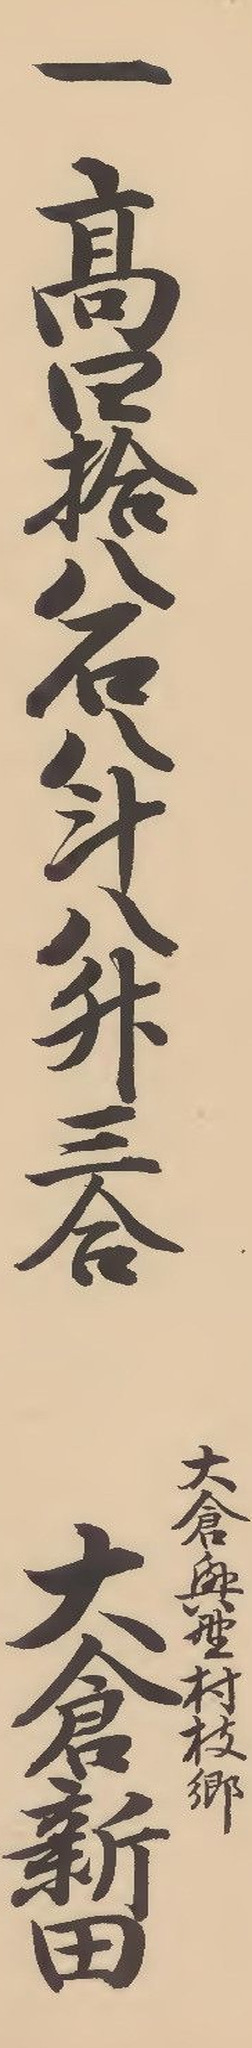一高四拾八石八斗八升三合大倉新田
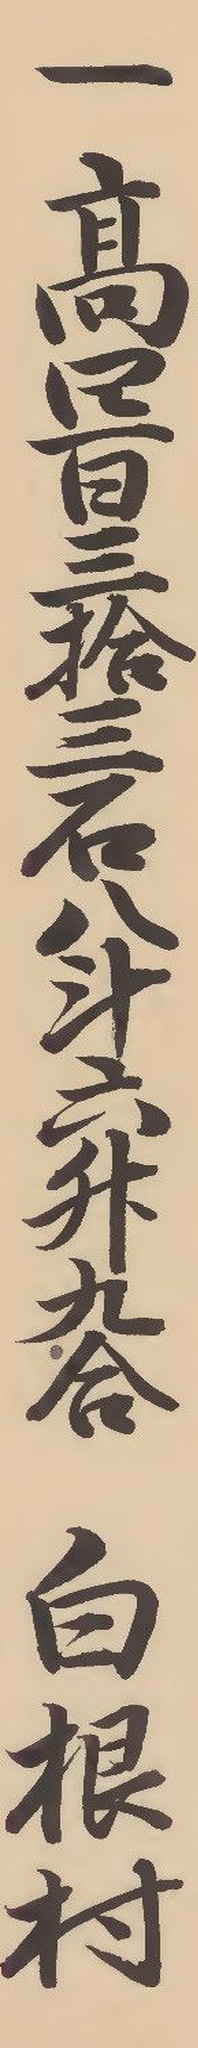一高四百三拾三石八斗六升九合白根村

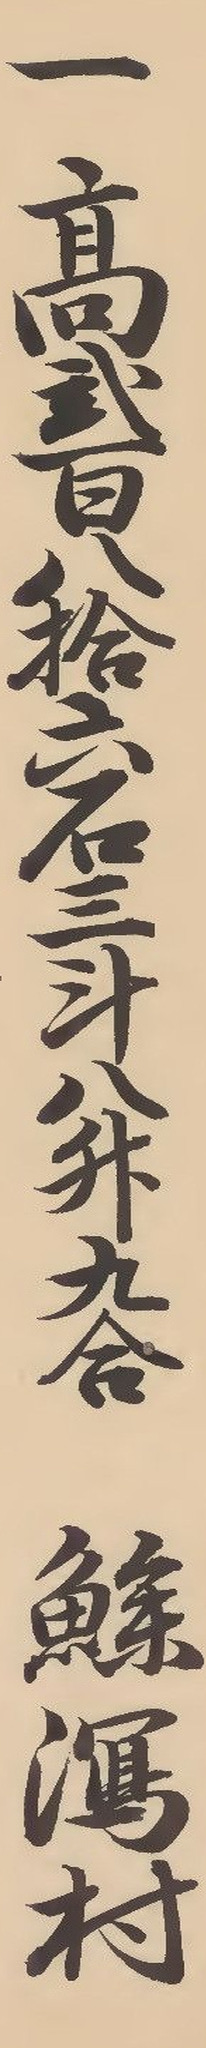一高弐百八拾六石三斗八升九合鯵潟村
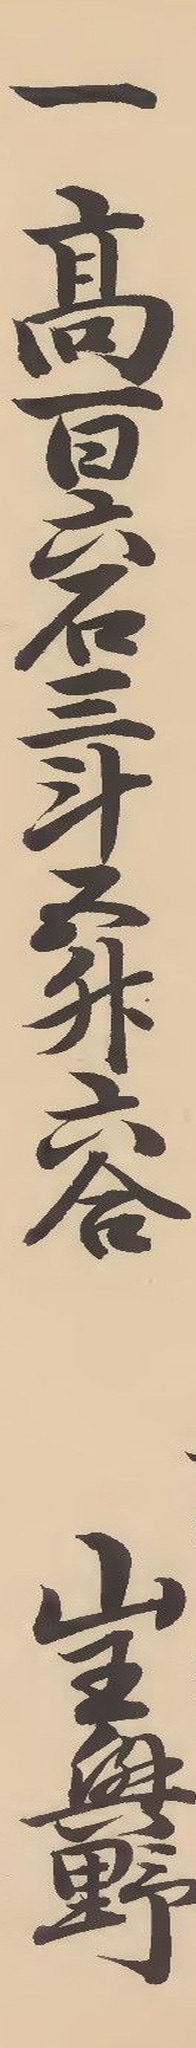一高百六石三斗五升六合山王興野
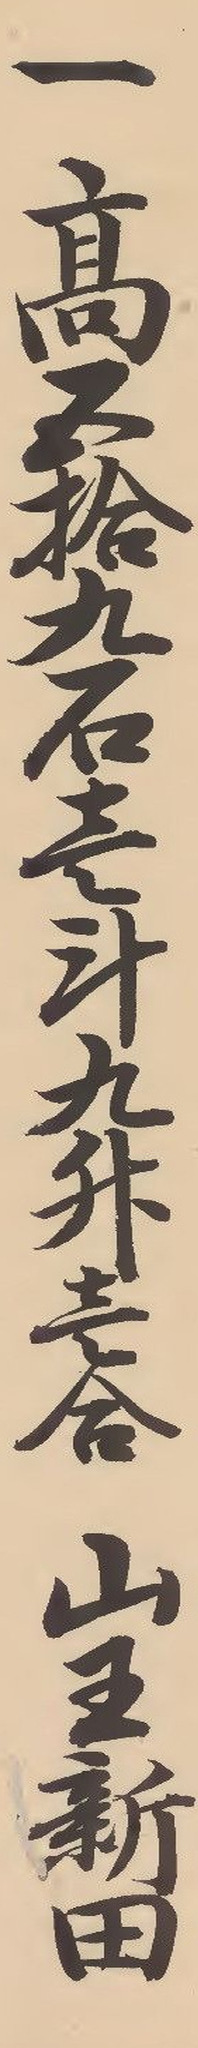一高五拾九石壱斗九升壱合山王新田
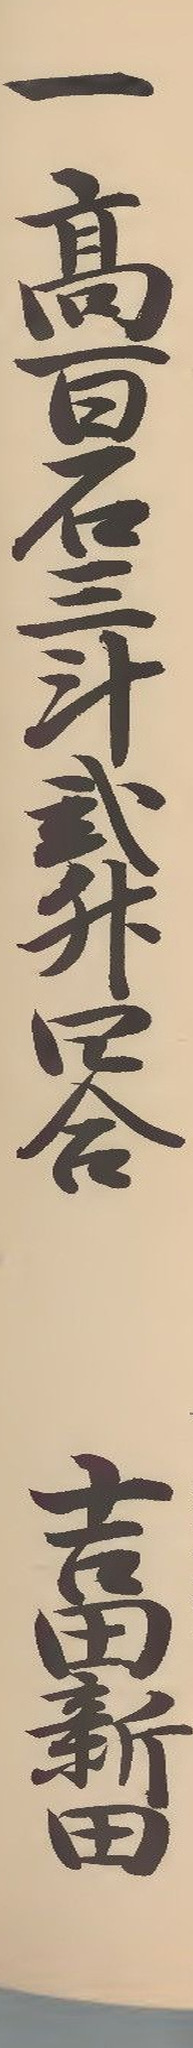一高百石三斗弐升四合吉田新田
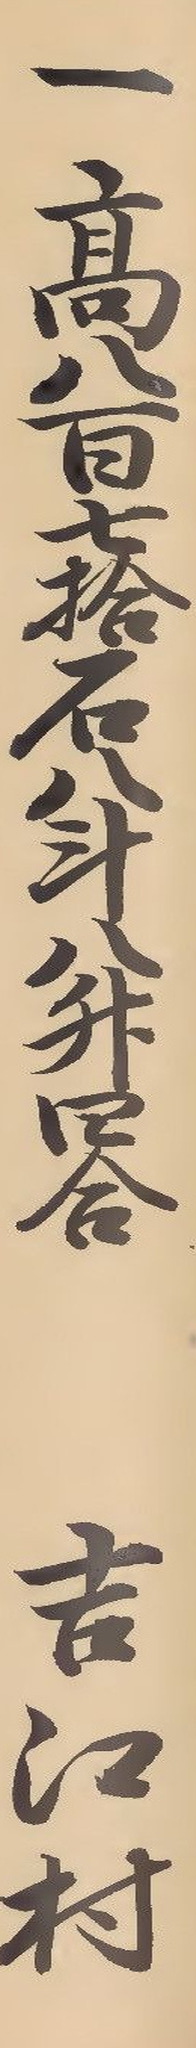一高八百七拾石八斗八升四合吉江村
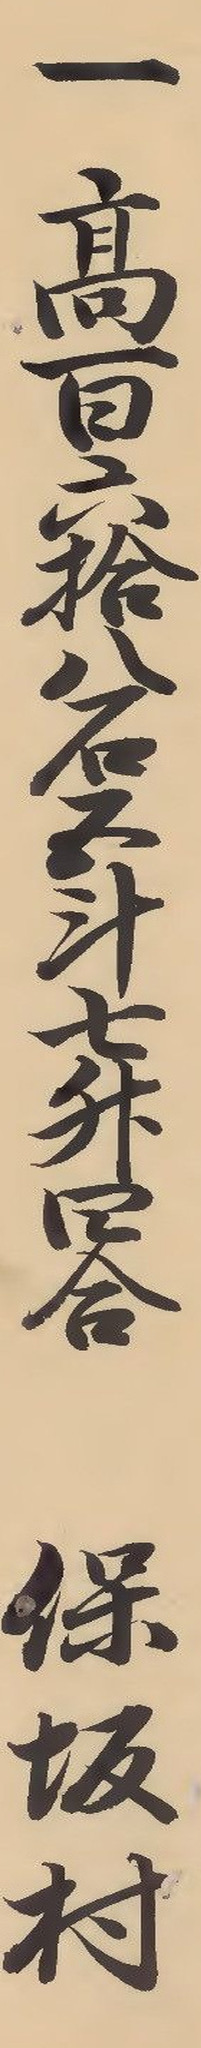一高百六拾八石五斗七升四合保坂村
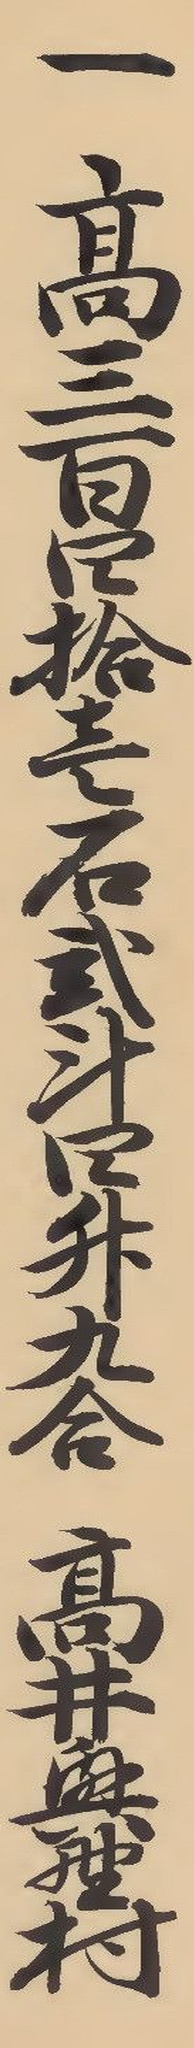一高三百四拾壱石弐斗四升九合高井興野村
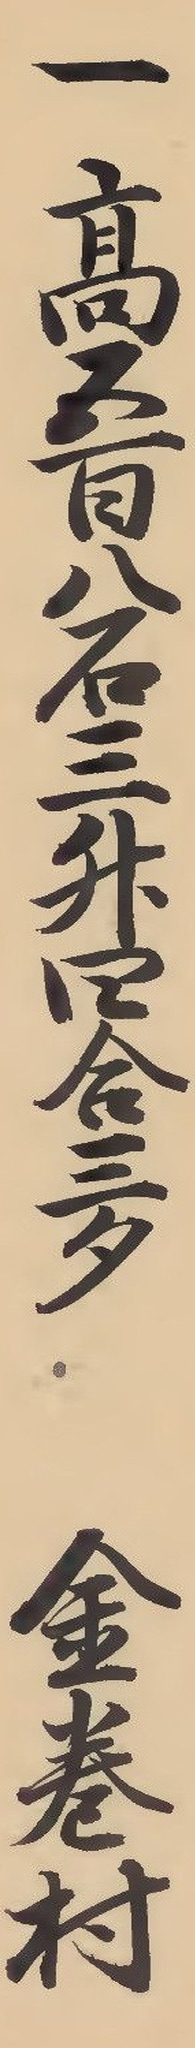一高五百八石三升四合三勺金巻村

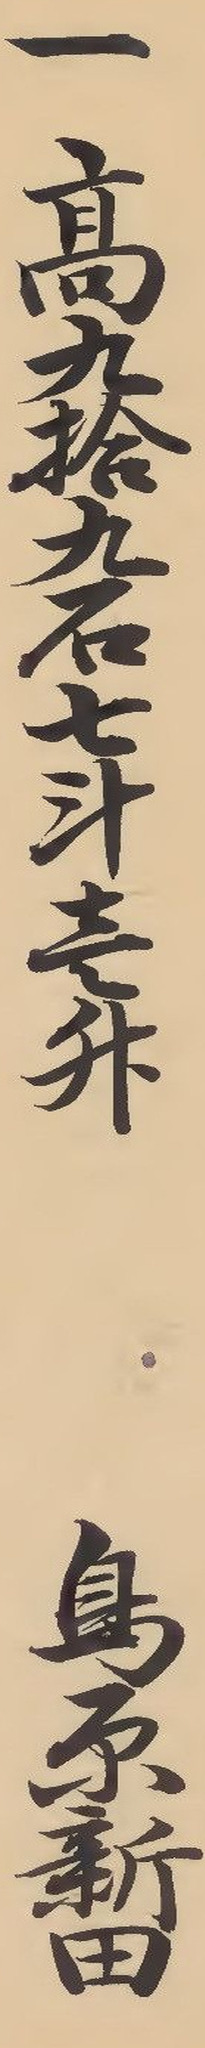一高九拾九石七斗壱升鳥原新田
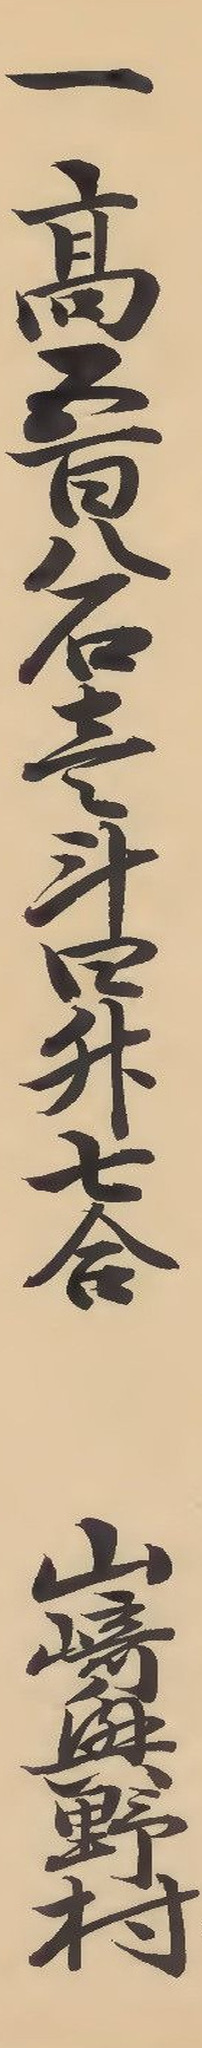一高五百八石壱斗四升七合山崎興野村
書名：越後国郷帳　下
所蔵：国立公文書館 National Archives of Japan
